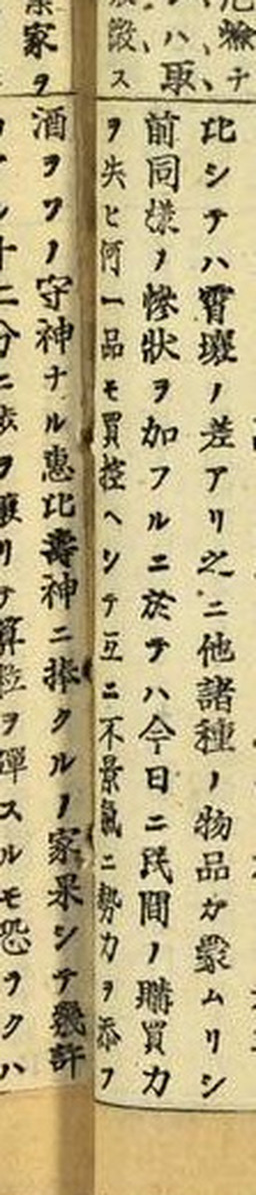前同様ノ惨狀ヲ加フルニ於テハ今日ニ民間ノ購買力
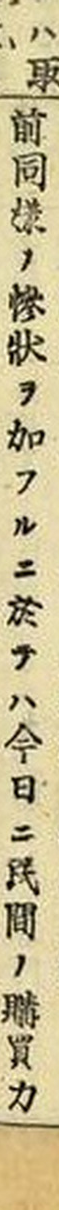前同様ノ惨狀ヲ加フルニ於テハ今日ニ民間ノ購買力
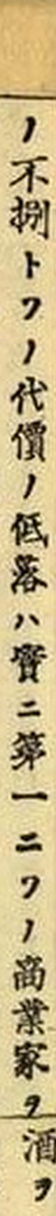ノ不捌トソノ代價ノ低落ハ實ニ第一ニソノ商業家ヲ
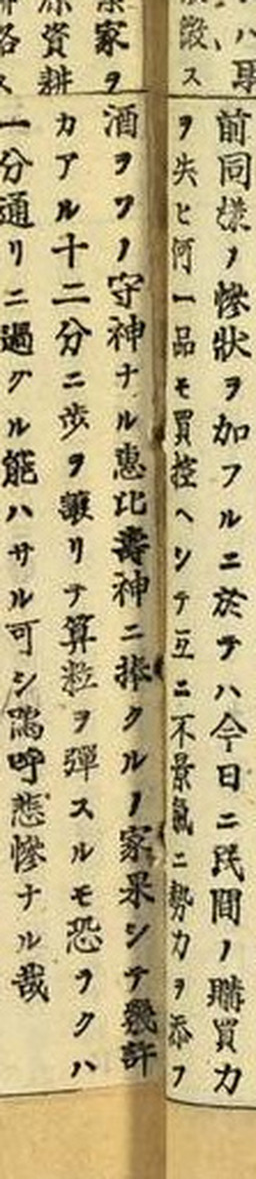酒ヲソノ守神ナル恵比壽神ニ捧クルノ家果シテ幾許
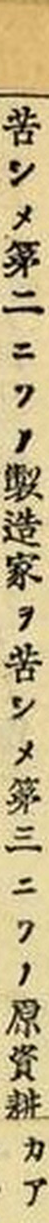苦シメ第二ニソノ製造家ヲ苦シメ第三ニソノ原資耕
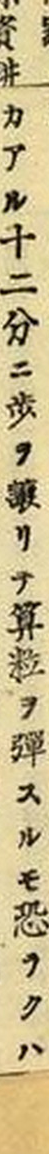カアル十二分ニ歩ヲ譲リテ算粒ヲ彈スルモ恐ラクハ
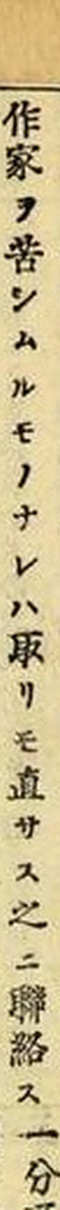作家ヲ苦シムルモノナレハ取リモ直サス之ニ聨絡ス
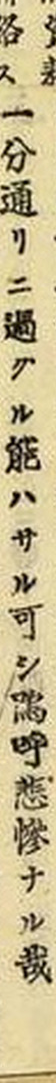一分通リニ過グル能ハサル可シ嗚呼悲惨ナル哉
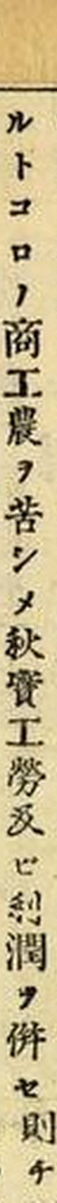ルトコロノ商工農ヲ苦シメ秋實工勞及ビ利潤ヲ倂セ
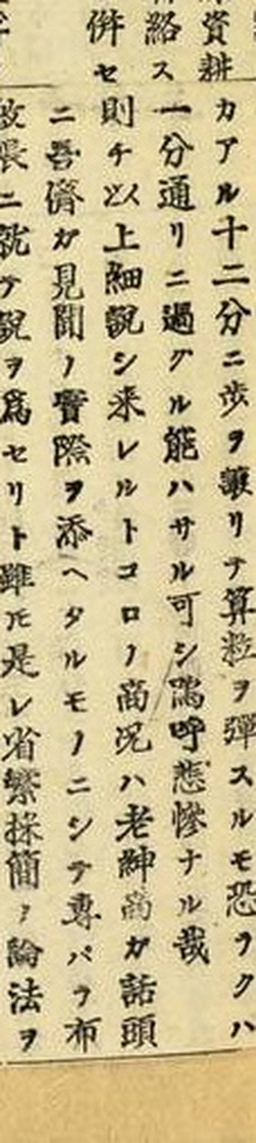則チ以上細說シ来レルトコロノ商况ハ老紳商ガ話頭
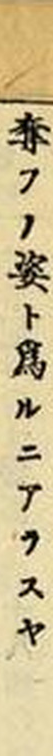奪フノ姿ト爲ルニアラスヤ
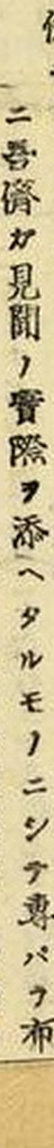ニ吾儕ガ見聞ノ實際ヲ添ヘタルモノニシテ専パラ布
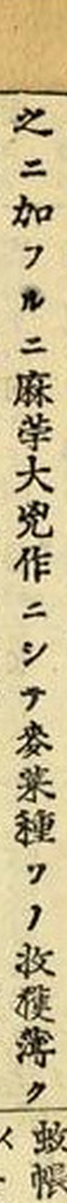之ニ加フルニ麻荢大兇作ニシテ麥菜種ソノ収穫薄ク
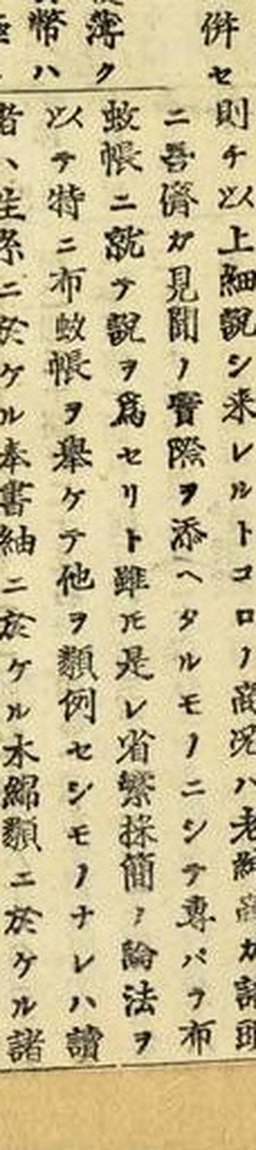蚊帳ニ就テ說ヲ爲セリト雖𪜈是レ省繁採簡ノ論法ヲ
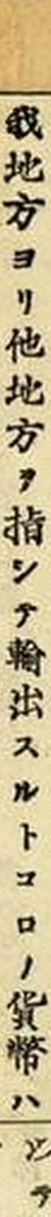我地方ヨリ他地方ヲ指シテ輸出スルトコロノ貨幣ハ
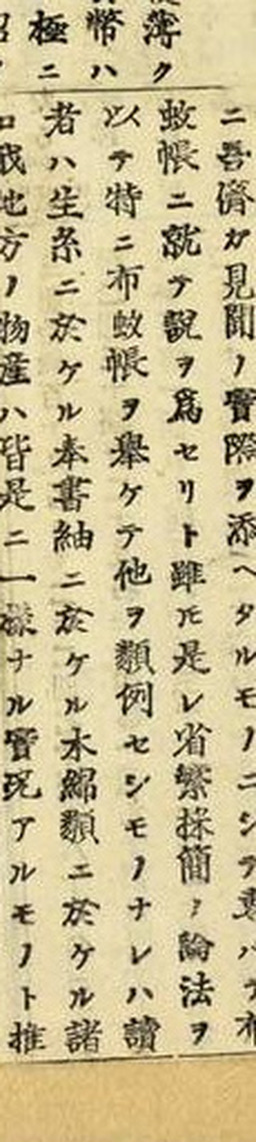以テ特ニ布蚊帳ヲ舉ケテ他ヲ類例セシモノナレハ讀
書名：温古集 五巻
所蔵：福井県文書館 Fukui Prefectural Archives
